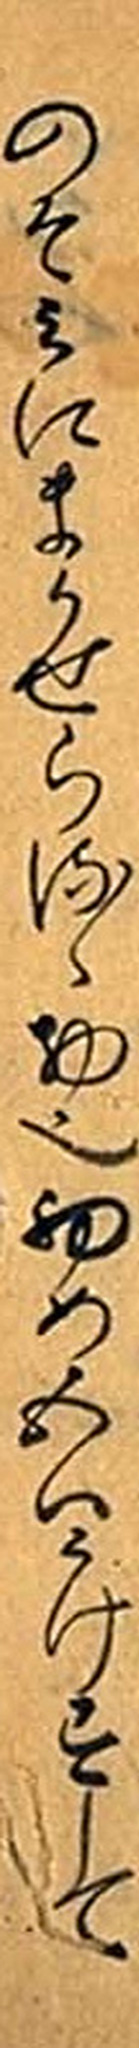のそみにまかせらるゝ物也初め五はうけすして
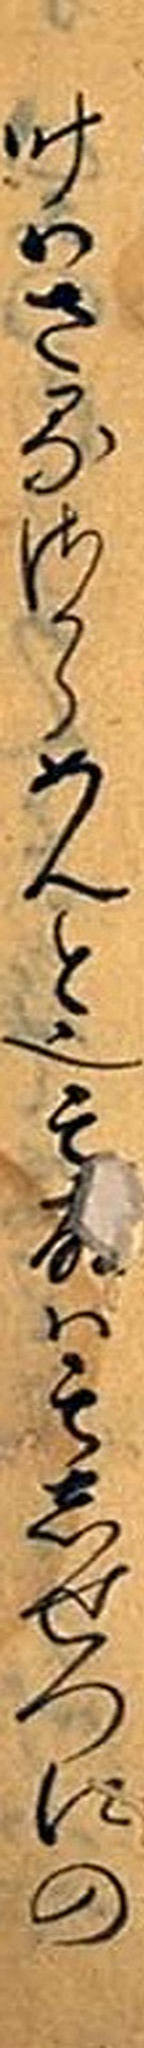叶はさるさからめんと也其故は其しせつにの
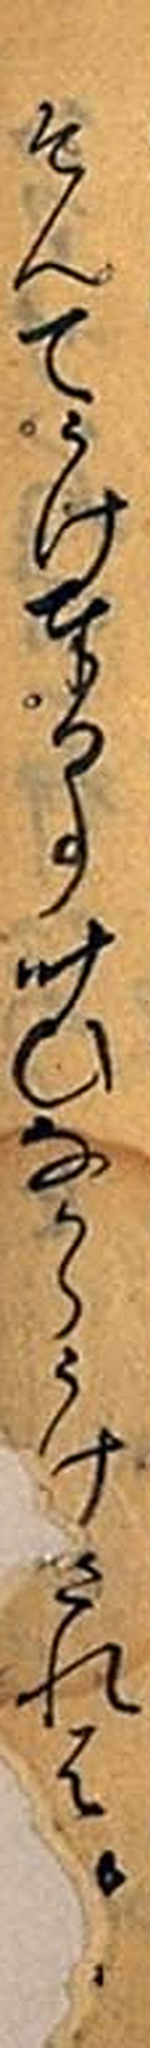そんてうけ奉る事叶ひなからうけされは

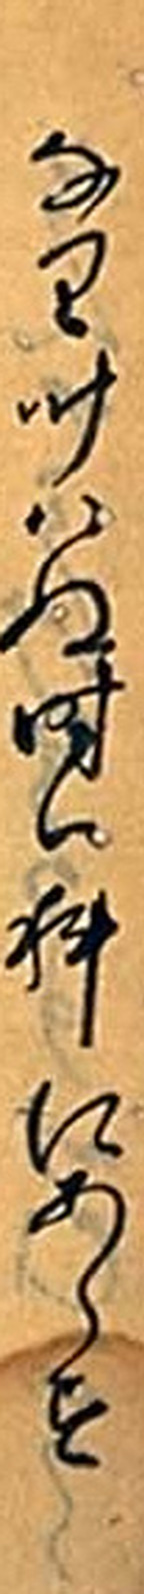なり叶はぬ時は科にあらす
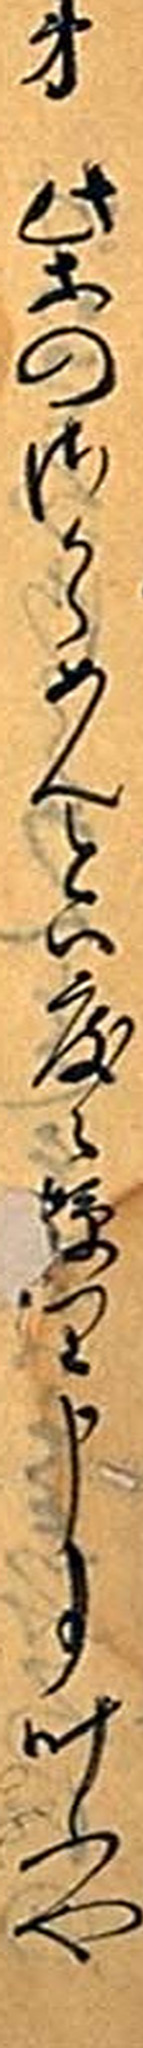弟此等のさからめんとは度々授り申事叶ふや
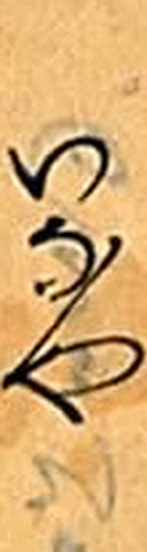いなや
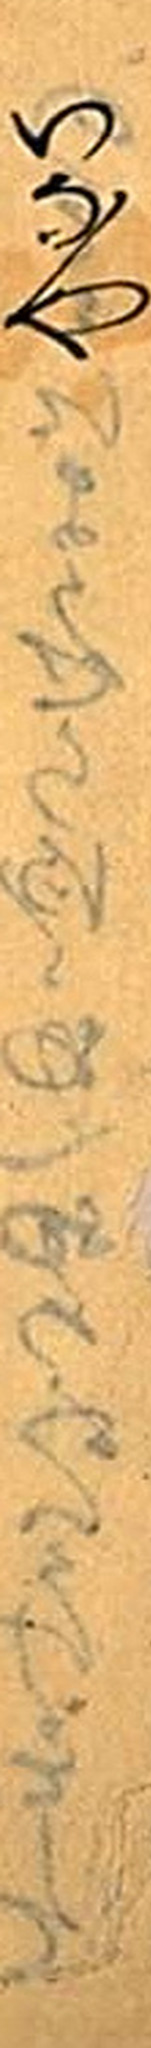いなや
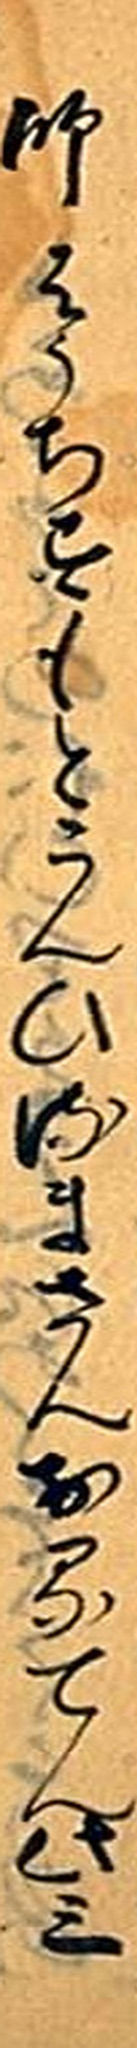師はうちすもとこんひるまさんおるてん此三
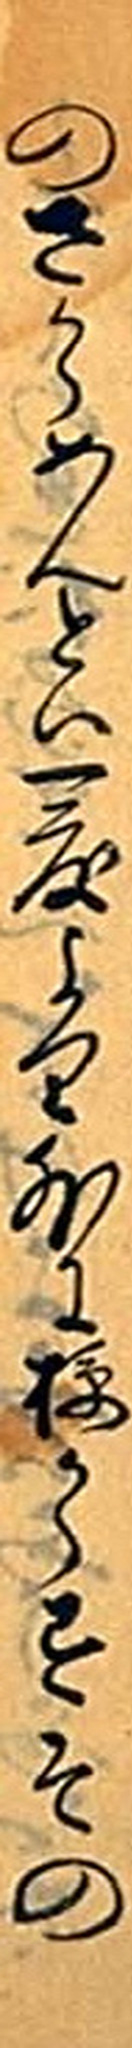のさからめんとは一度より外に授からすその
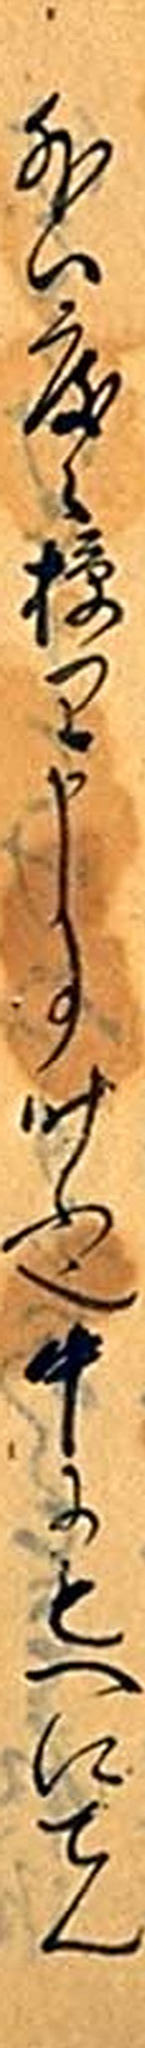外は度々授り申事叶ふ也中にもへにてん
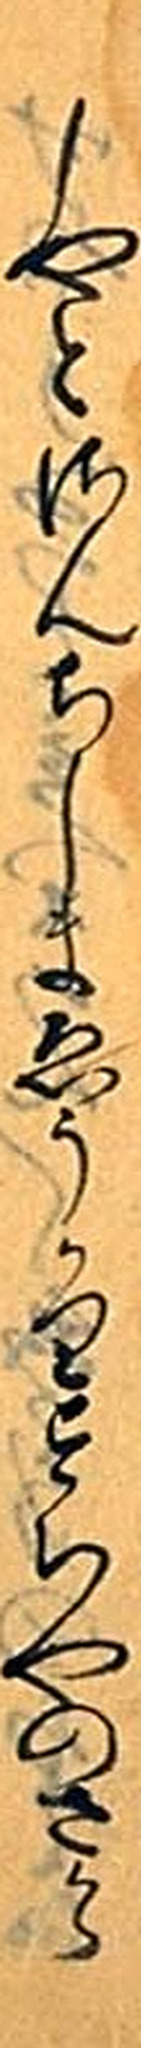しやとさんちしまゑうかりすちやのさから
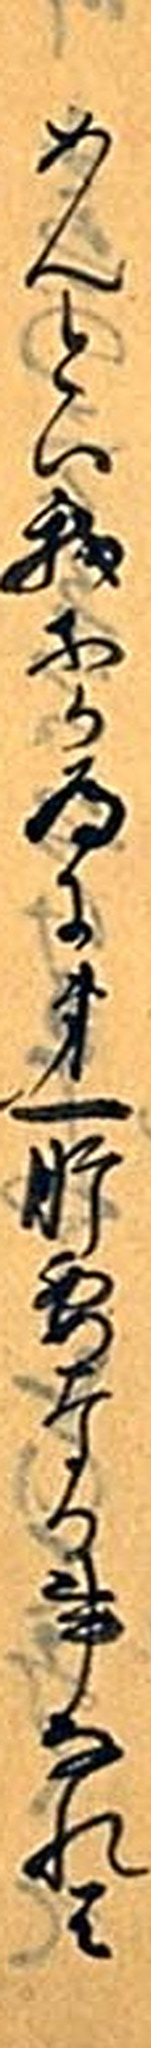めんとは我等か為に第一肝要なる事なれは
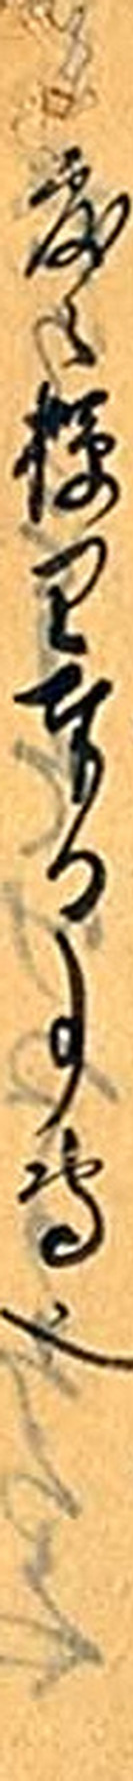度々授り奉る事専也
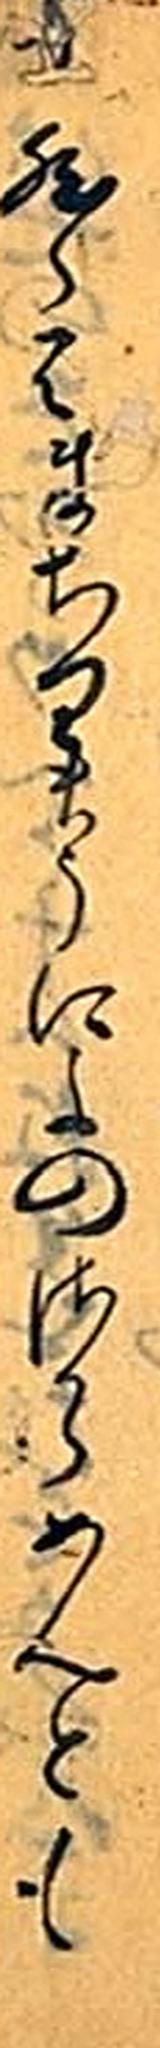弟然らはまちりまうによのさからめんとも
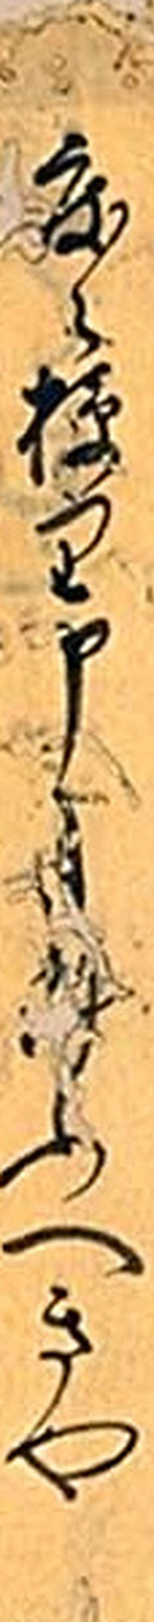度々授り申叶ふへきや
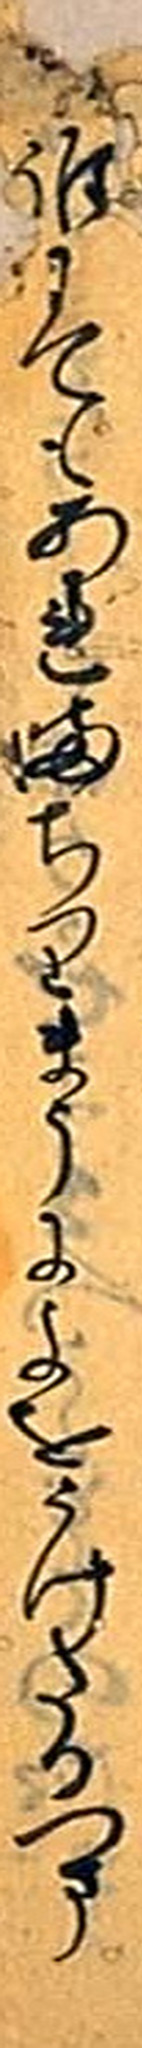師誰にてもあれまちりまうによをうけたるつま
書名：ドチリナ・キリシタン
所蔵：東京大学総合図書館 / General Library in the University of Tokyo
